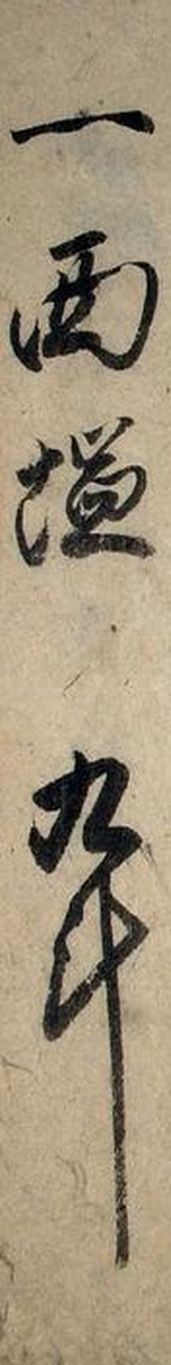一西塩九斗

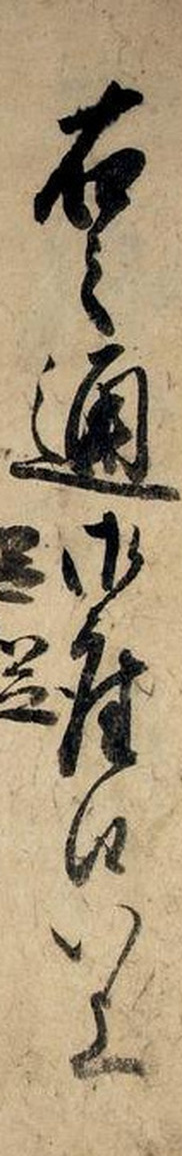右之通御座候以上
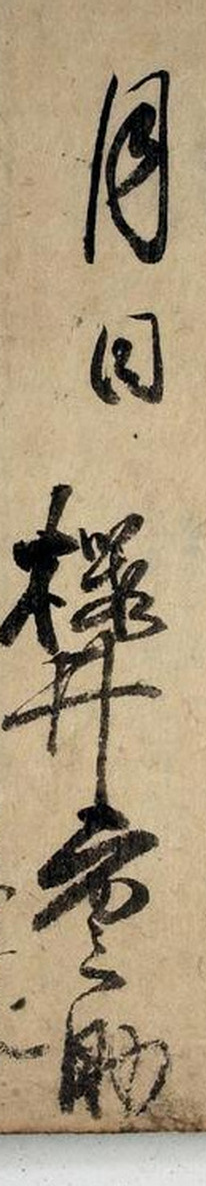月日桜井市之助
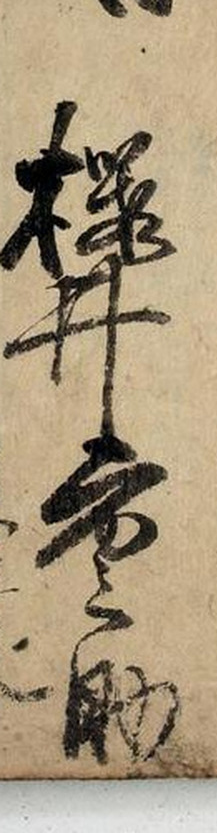月日桜井市之助
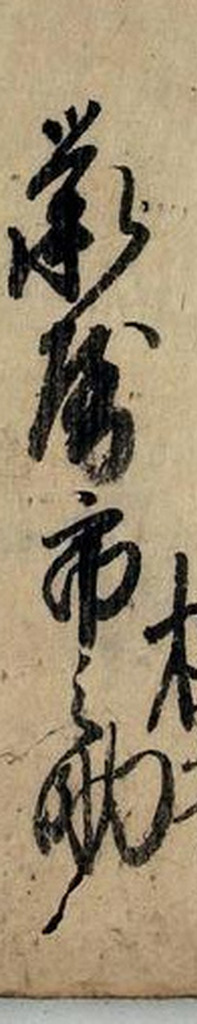承屋市之助
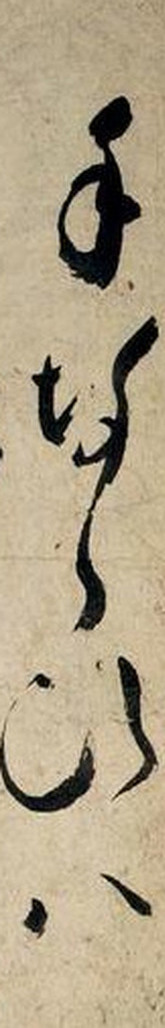手ならひは
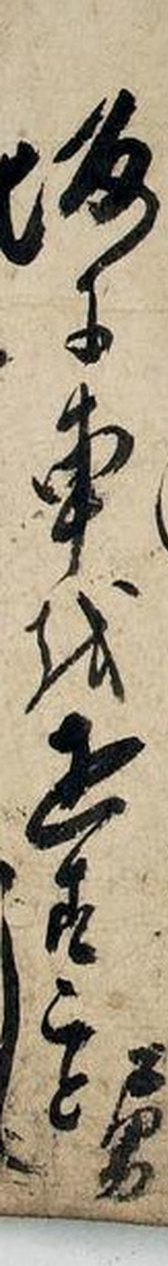坂に車ををすことし
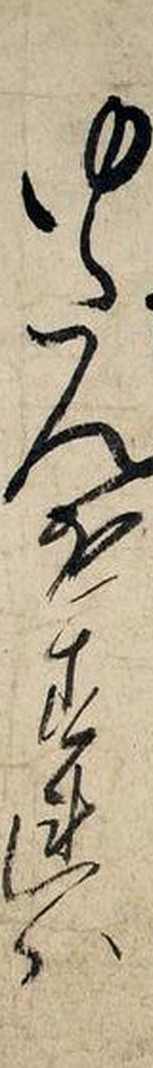ゆたんをすれは

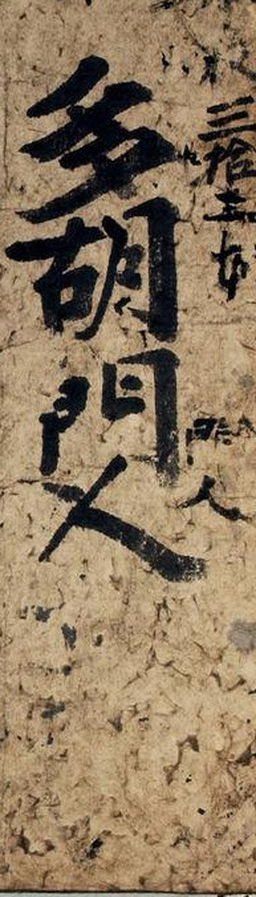多胡門人
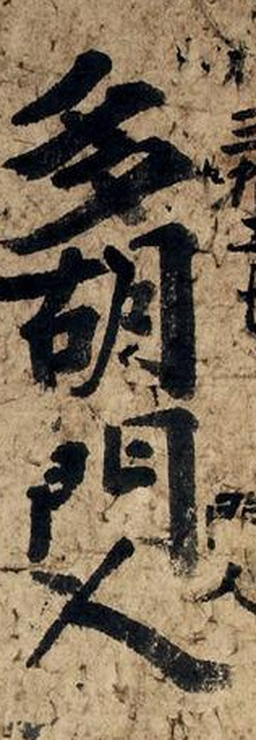多胡門人
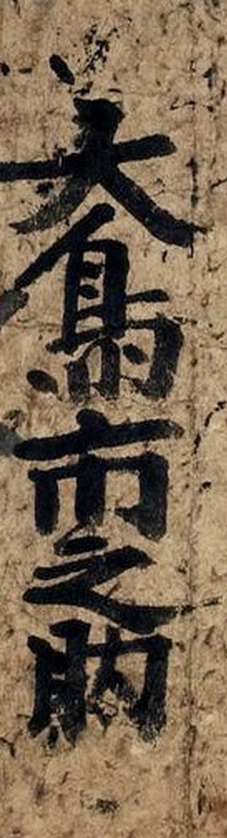大鳥市之助
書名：御手本（手習、いろは・数字、「名頭之事」「親戚字尽」「相庭之…
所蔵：福井県文書館 Fukui Prefectural Archives
